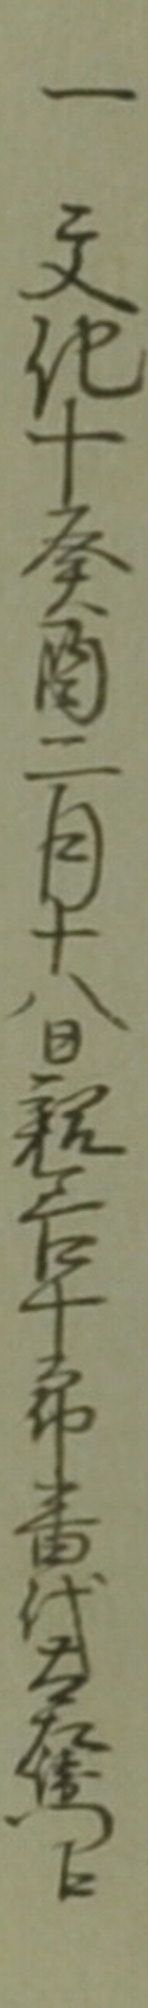一文化十癸酉二月十八日親善十郎番代太左衛門江
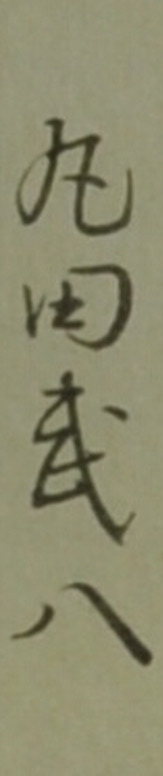丸田武八
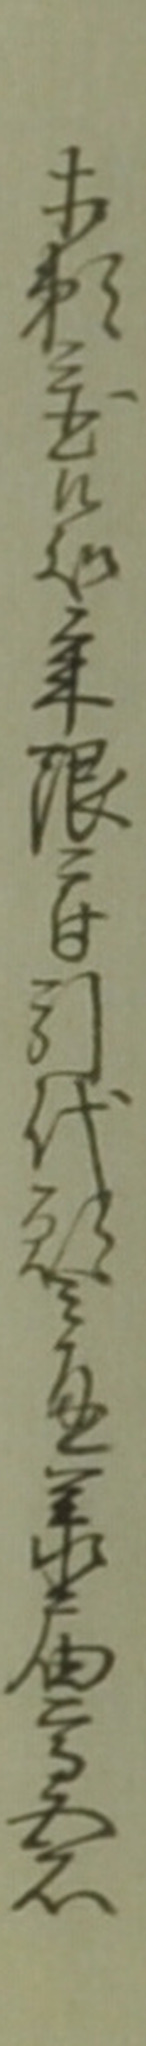相頼置候処年限ニ付引代願之通承届高五石
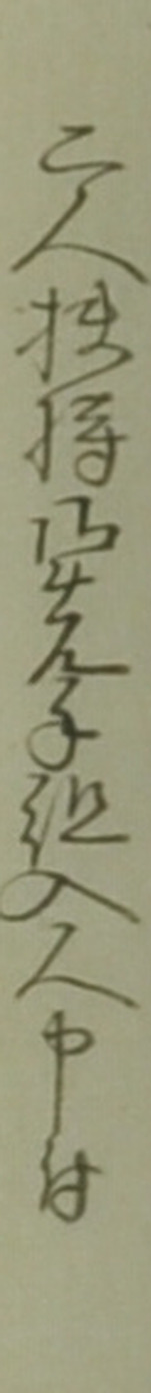二人扶持御先手組入人申付

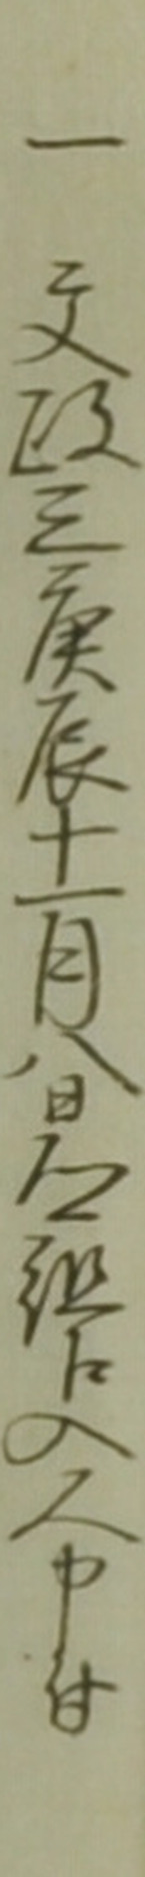一文政三庚辰十一月八日郷組江入人申付
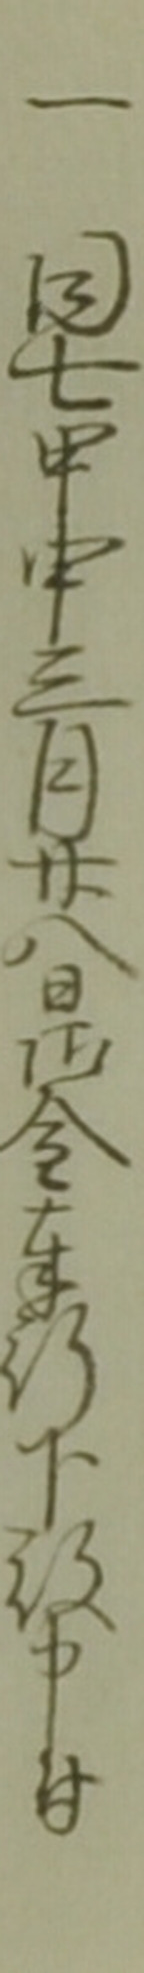一同七甲申三月廿八日御金奉行下役申付
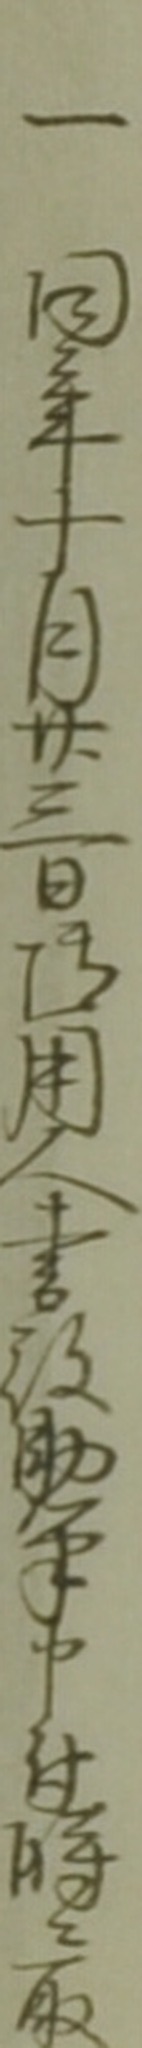一同年十月廿三日御用人書役助筆申付時ニ取
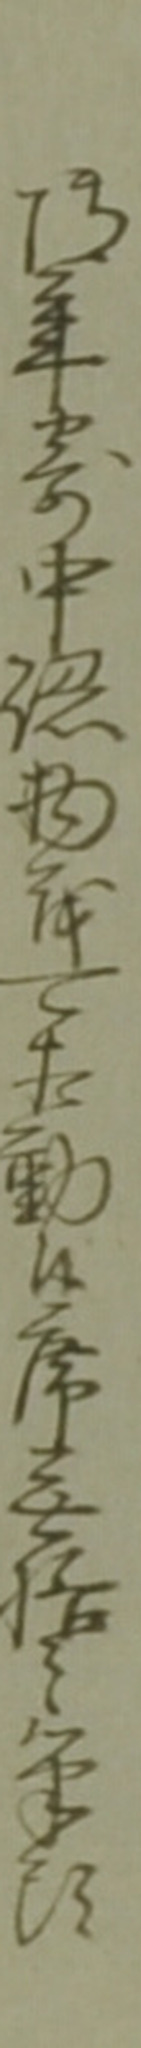御年寄中認物茂可相勤候席無格之筆頭
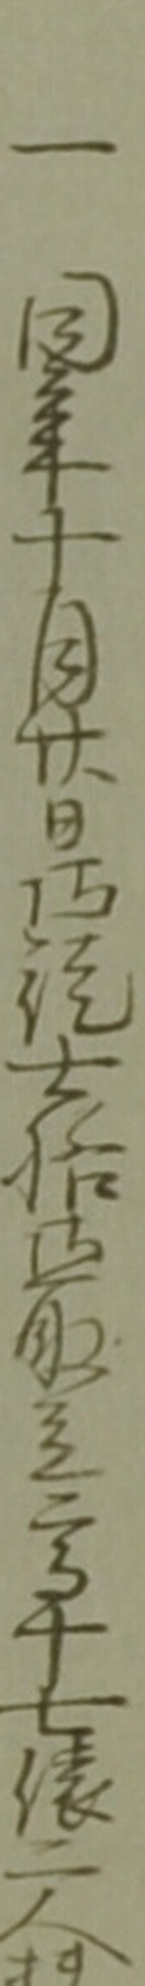一同年十月廿日御徒士格御取立高十七高二人扶持
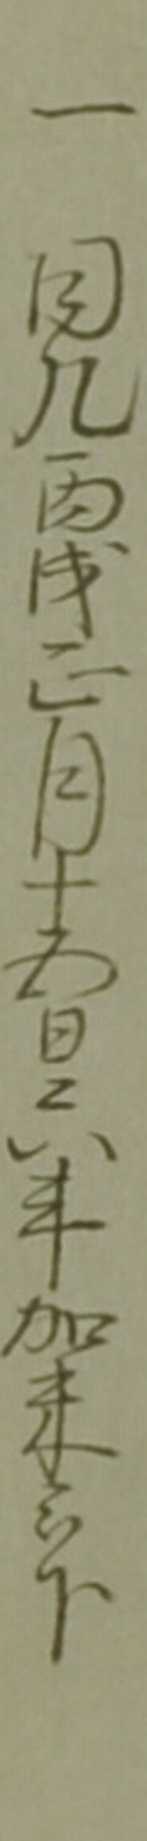一同九丙戌正月十五日六斗加米被下
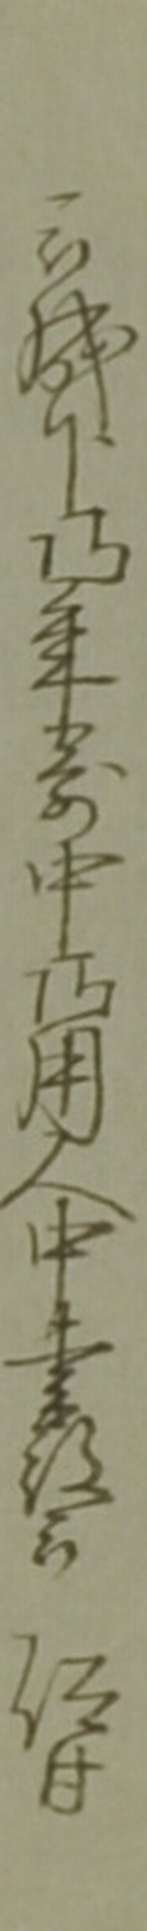被成下御年寄中御用人中書役被仰付
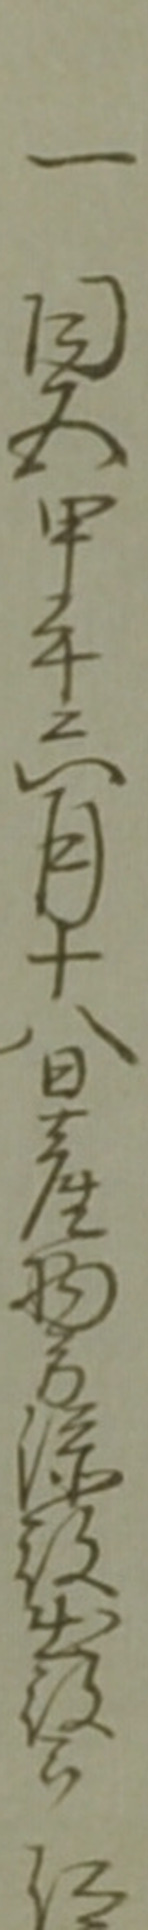一同五甲午六月十八日産物方添役出役被仰付
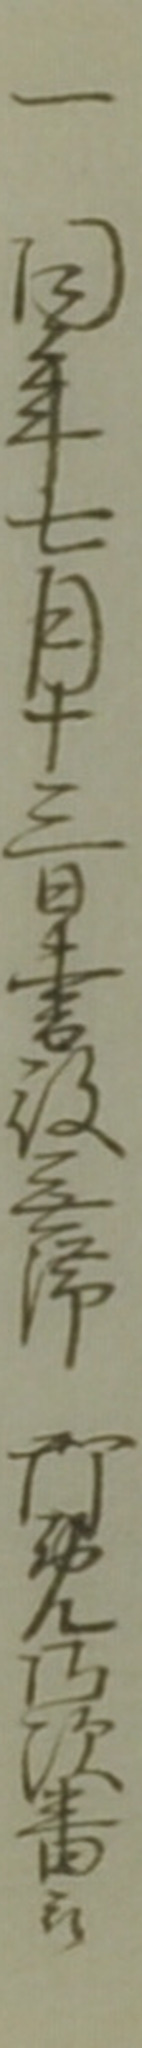一同年七月十三日書役無滞御免御次番被
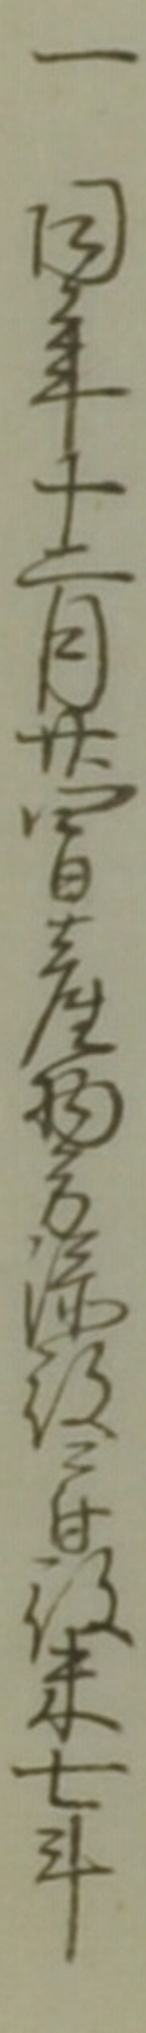一同年十二月廿四日産物方添役ニ付役米七斗
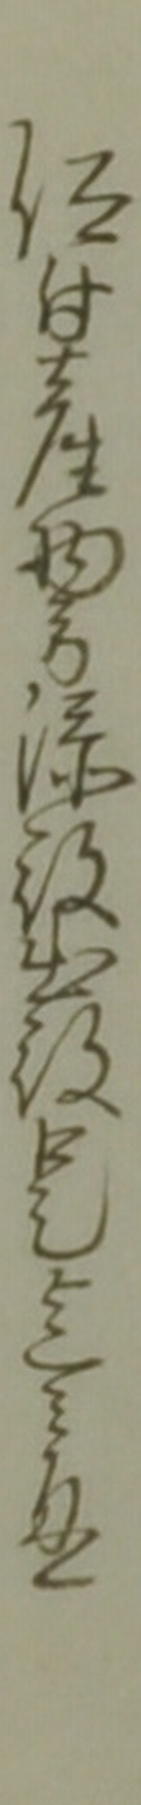仰付産物方添役出役是迄之通
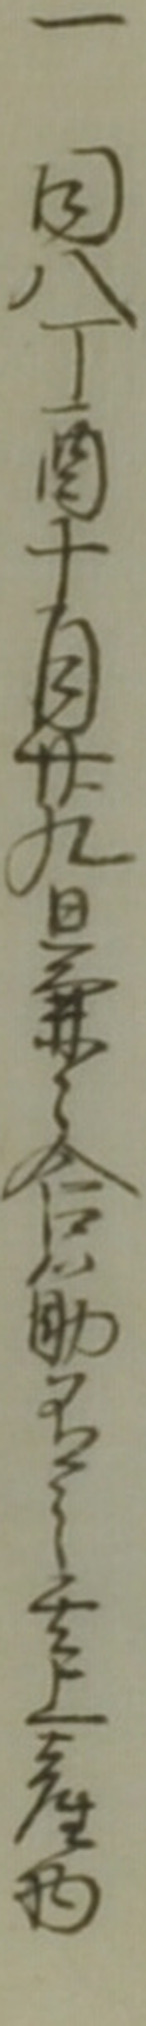一同八丁酉十月廿九日兼々含筋有之其上産物
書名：無足諸士勤仕録（九）
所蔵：伊那市立高遠町図書館・合同会社AMANE
